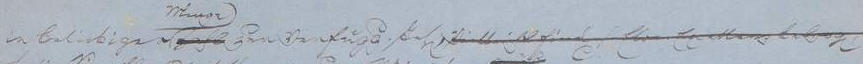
in beliebiger ZahlMenge zur Verfügg. stehen, Vielleicht finden s. Ewr. Excellenz bewogen,
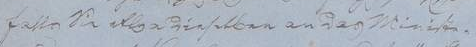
falls Sie etwa dieselben an das Ministe-
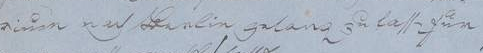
rium nach Berlin gelangen zu lassen für
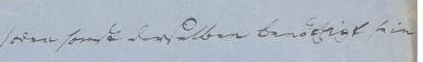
Ioder sonst derselben benöthigt sein sollten.
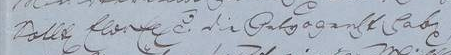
Sollten Ewr Excz die Gewogenht haben,
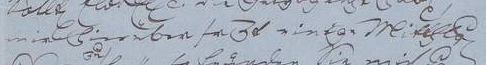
mir hierüber sr Zt einige Mitthlungen
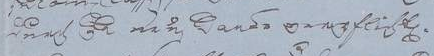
durch zu neuem Danke verpflichten.
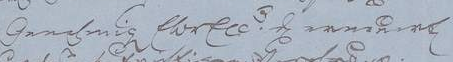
Genehmigen Ewr Excz den erneuerten
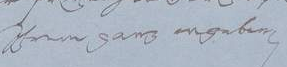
Ihrem ganz ergebenen
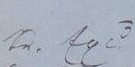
Sr. Excz
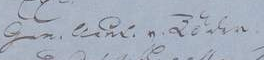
Herrn Gen.Leut. v. Röder
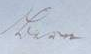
Bern.
